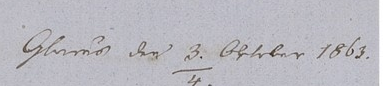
Glarus den 3./4. Oktober 1863.
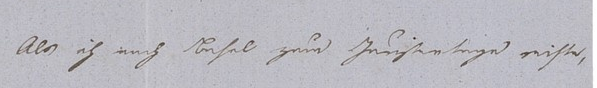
Als ich nach Basel zum Juristentage reiste,
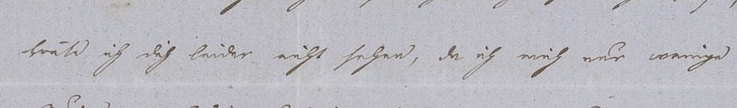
konnte ich Dich leider nicht sehen, da ich mich nur wenige
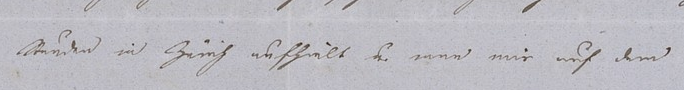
Stunden in Zürich aufhielt u. man mir auf dem
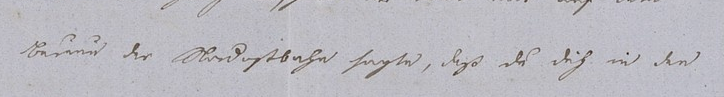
Bureau der Nordostbahn sagte, daß Du Dich in den
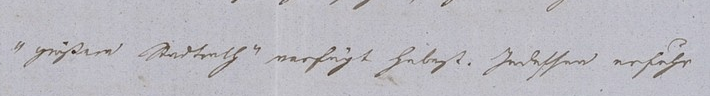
«größern Stadtrath» verfügt habest. Indessen erfuhr
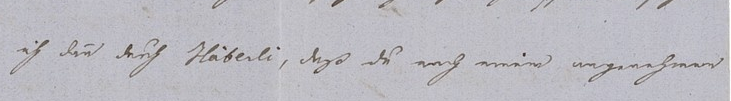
ich dann durch Häberli, daß Du nach einem angenehmen
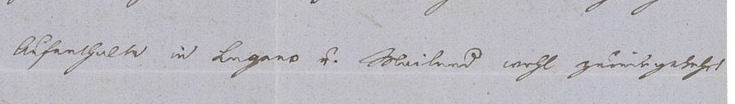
Aufenthalte in Lugano u. Mailand wohl zurückgekehrt
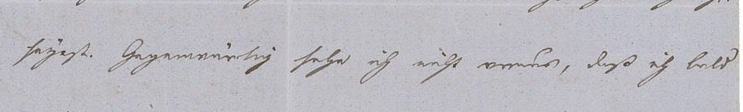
seyest. Gegenwärtig sehe ich nicht voraus, daß ich bald
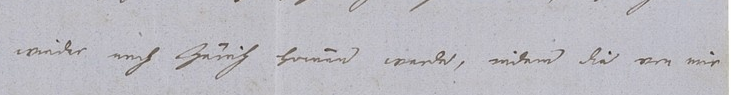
wieder nach Zürich kommen werde, indem die von mir
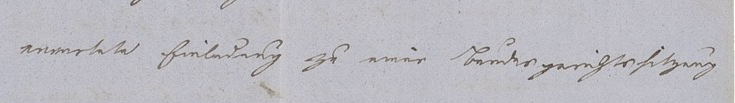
erwartete Einladung zu einer Bundesgerichtssitzung
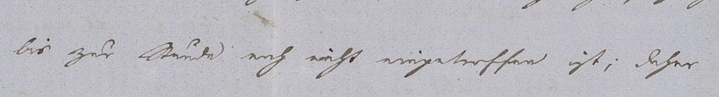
bis zur Stunde noch nicht eingetroffen ist; daher
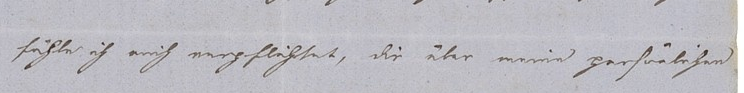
fühle ich mich verpflichtet, Dir über meine persönlichen
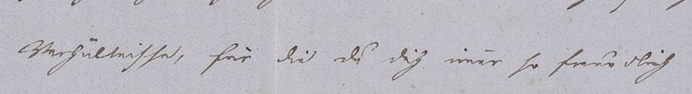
Verhältnisse, für die Du Dich immer so freundlich
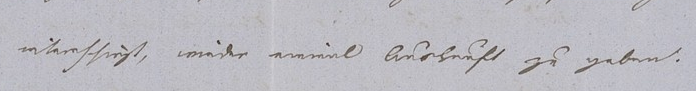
interessirst, wieder einmal Auskunft zu geben.
